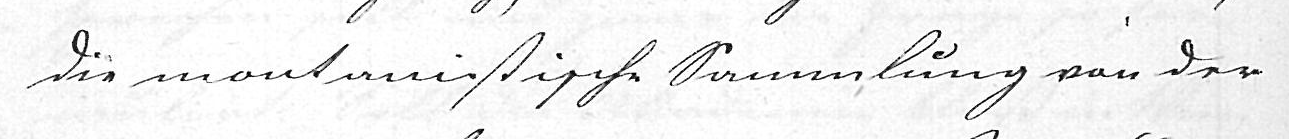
die montanistische Sammlung von der
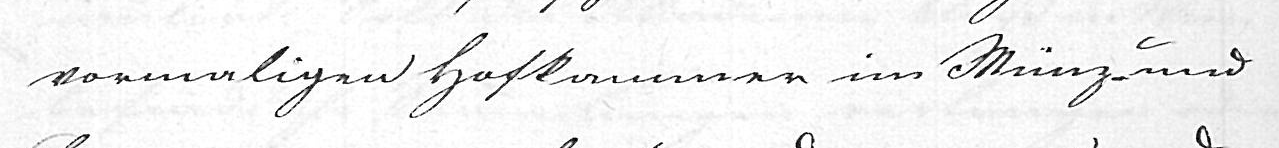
vormaligen Hofkammer im Münz- und
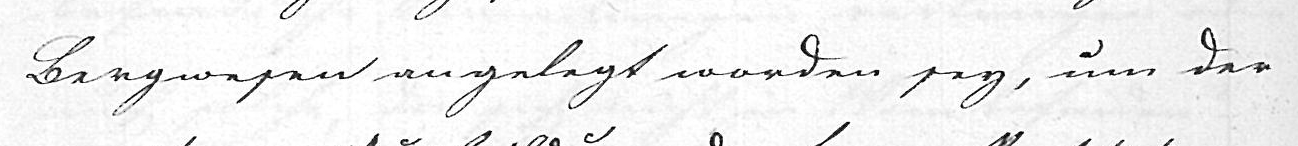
Bergwesen angelegt worden sey, um der
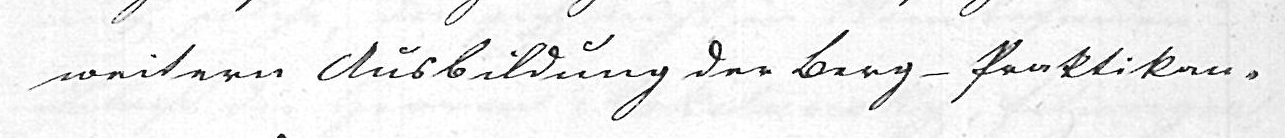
weiteren Ausbildung der Berg-Praktikan-
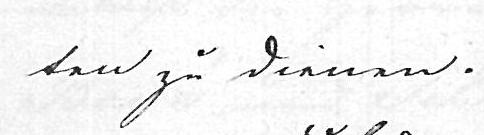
ten zu dienen.
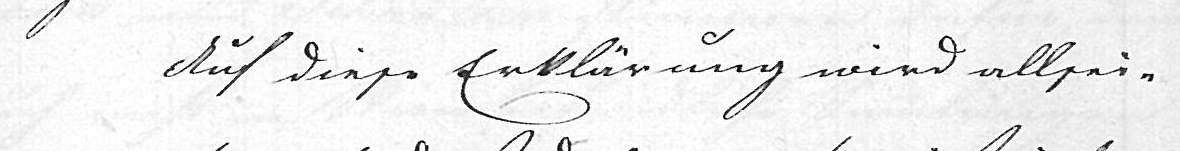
Auf diese Erklärung wird allsei-
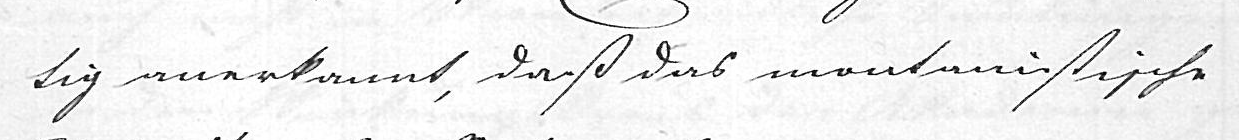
tig anerkannt, daß das montanistische
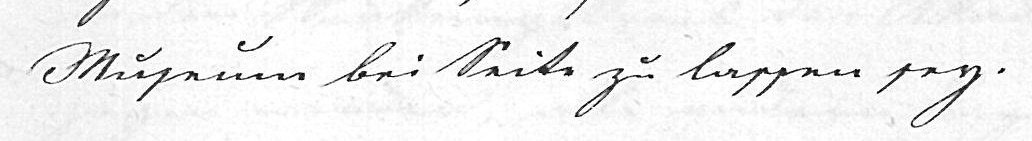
Museum bei Seite zu lassen sey.
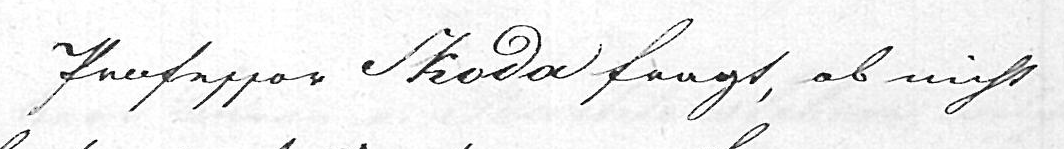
Professor Skoda fragt, aus nicht
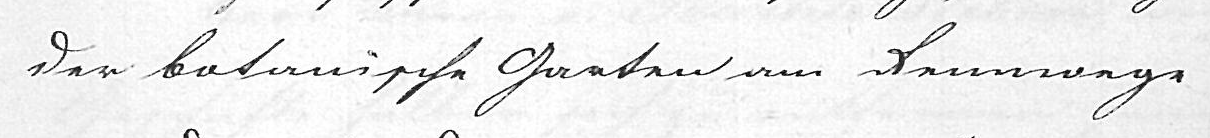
der botanischen Garten am Rennwege
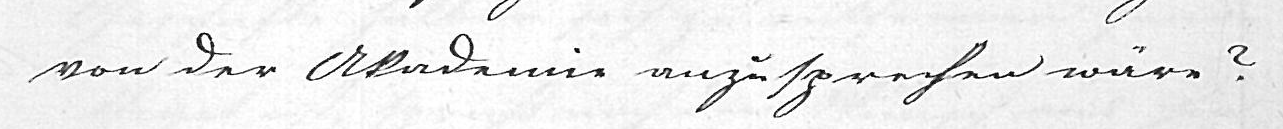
von der Akademie anzusprechen wäre?
